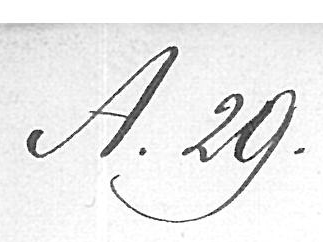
A. 29.
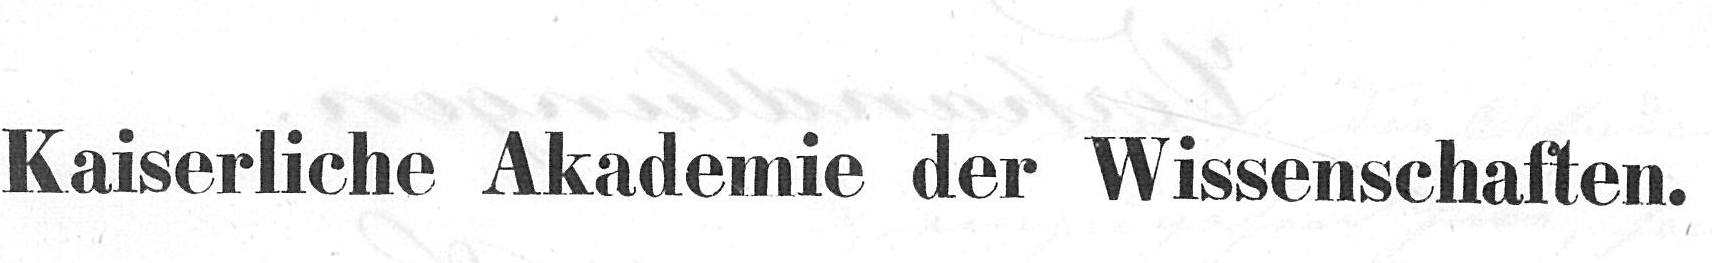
Kaiserliche Akademie der Wissenschaften.
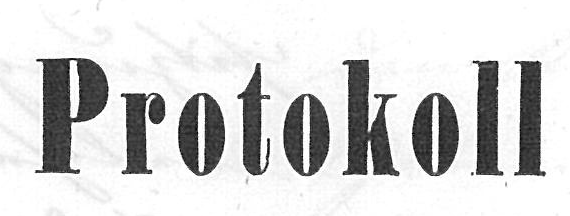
Protokoll
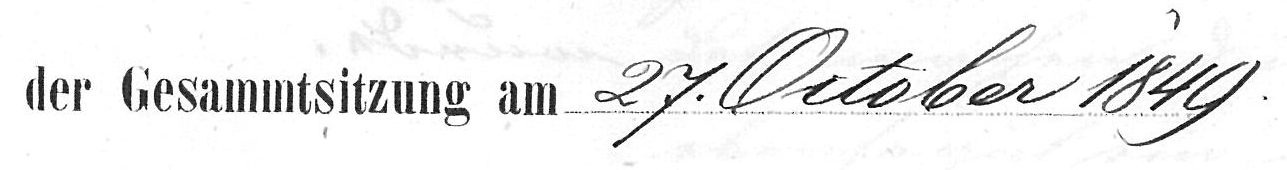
der Gesammtsitzung am 27. October 1849
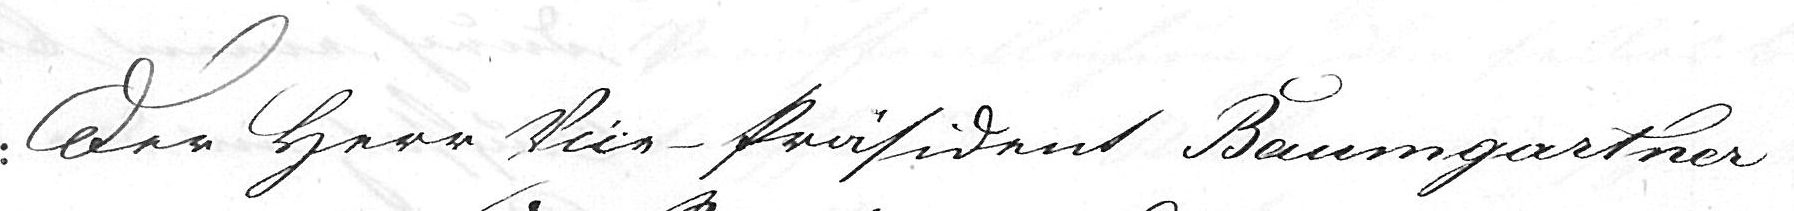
Der Herr Vice-Präsident Baumgartner
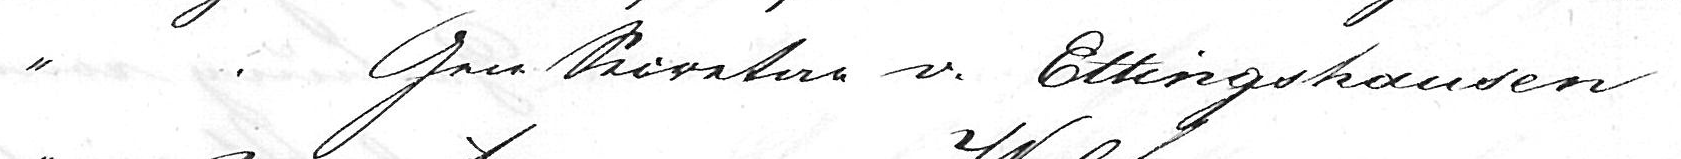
" - Gen.Secretär v. Ettingshausen
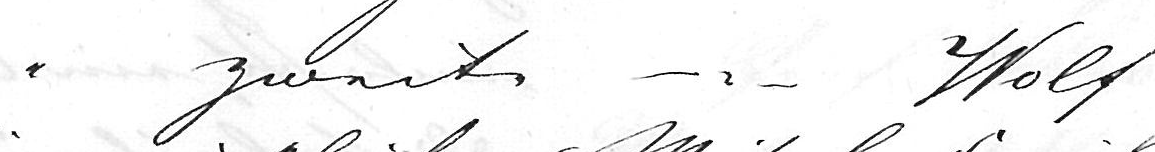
" zweite -"- Wolf
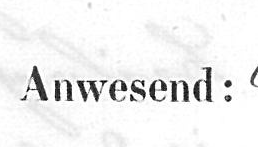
Anwesend:
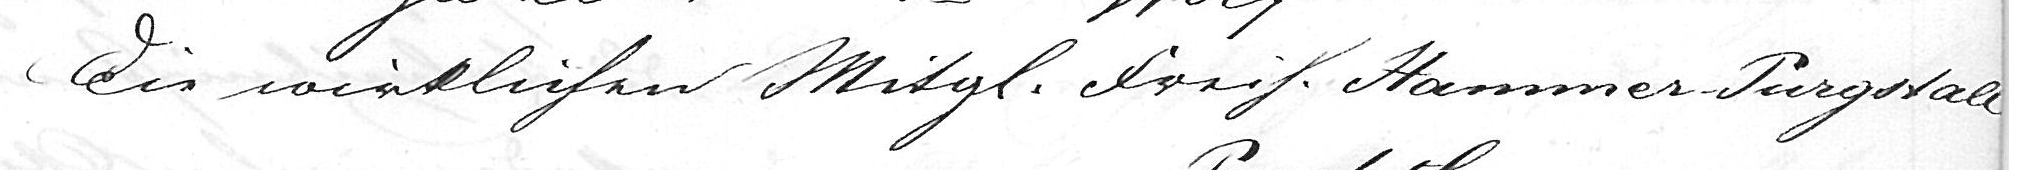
Die wirklichen Mitgl. Freih. Hammer-Purgstall
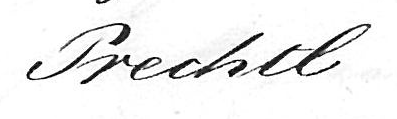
Prechtl
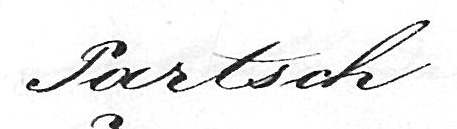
Partsch
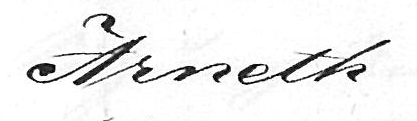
Arneth
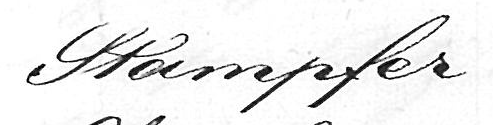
Stampfer
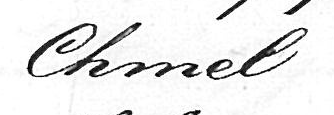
Chmel
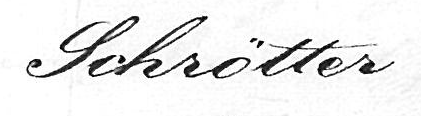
Schrötter
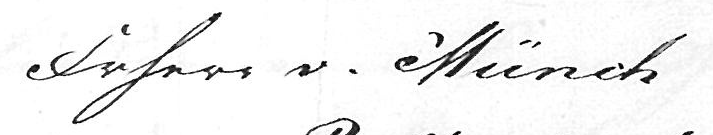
Frherr v. Münch
